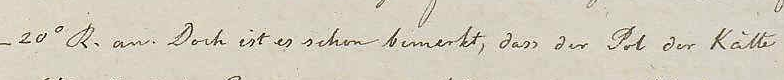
−20° R. an. Doch ist es schon bemerkt, dass der Pol der Kälte
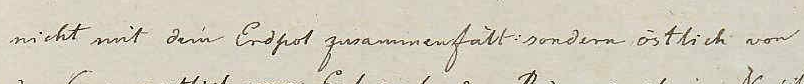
nicht mit dem Erdpol zusammenfält: sondern östlich von
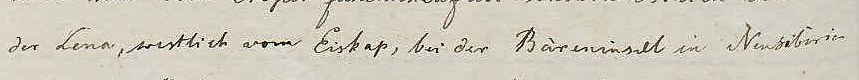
der Lena, westlich vom Eiskap, bei der Bäreninsel in Neusibirien
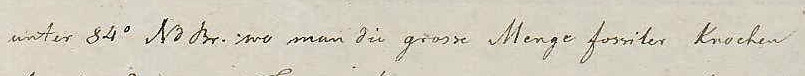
unter 84° Ndbr. wo man die grosse Menge fossiler Knochen
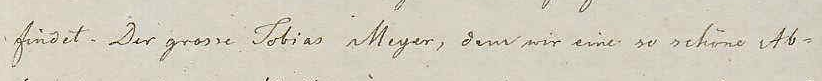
findet. Der grosse Tobias Meyer, dem wir eine so schöne Ab-
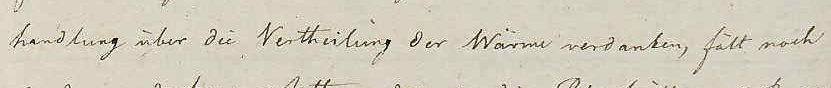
handlung über die Vertheilung der Wärme verdanken, fält noch
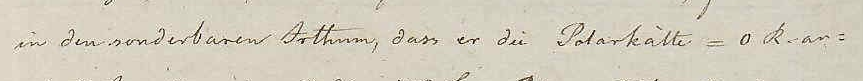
in den sonderbaren Irthum, dass er die Polarkälte 0 R. an-
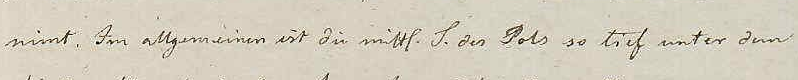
nimt. Im allgemeinen ist die mittl. T. des Pols so tief unter dem
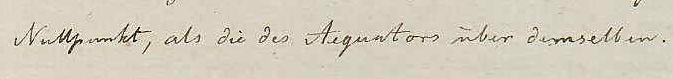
Nullpunkt, als die des Aequators über demselben.
